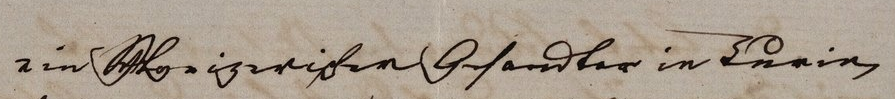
ein Schweizerischer Gesandter in Turin
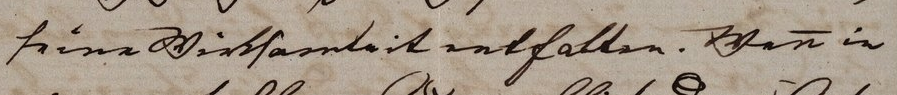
seine Wirksamkeit entfalten. Wenn in
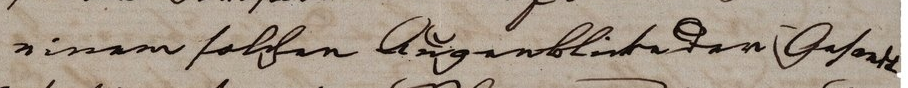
einem solchen Augenblicke der Gesandt-
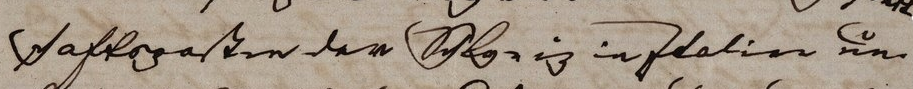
schaftsposten der Schweiz in Italien un-
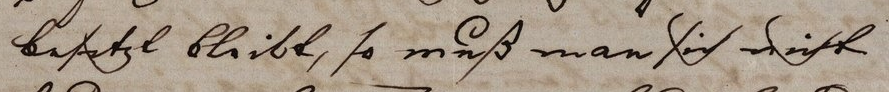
besetzt bleibt, so muß man sich nicht
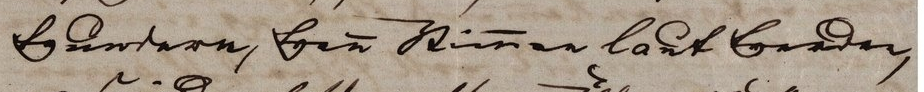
wundern, wenn Stimmen laut werden,
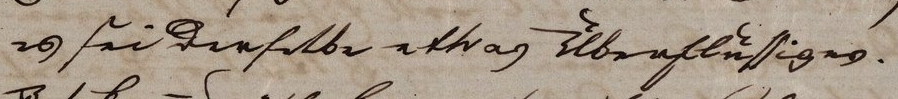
es sei Derselbe etwas Überflüssiges.
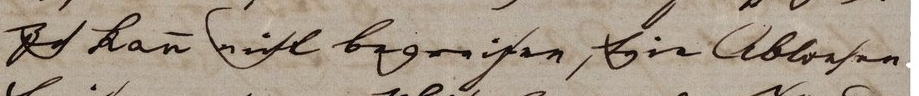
Ich kann nicht begreifen, wie Abwesen-
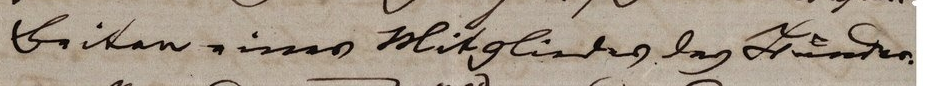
heiten eines Mitgliedes des Bundes-
